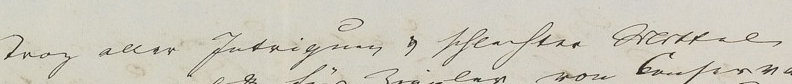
Troz aller Intriguen & schlechter Mittel,
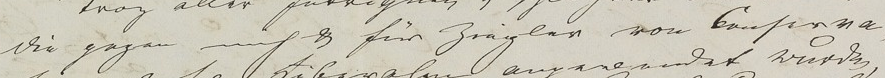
die gegen mich & für Ziegler von Conserva-
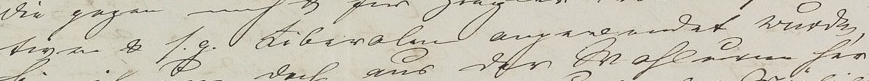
tiven & s.g. Liberalen angewendet wurden,
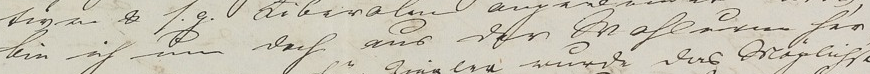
bin ich nun doch aus der Wahlurne her-
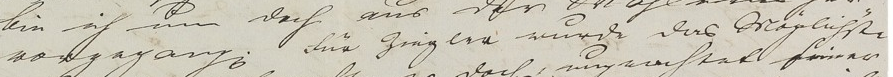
vorgegangen. Für Ziegler wurde das Möglichste
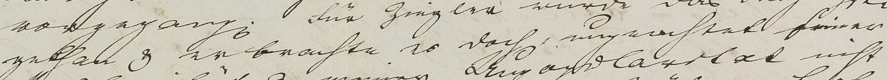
gethan & er brachte es doch ungeachtet seiner
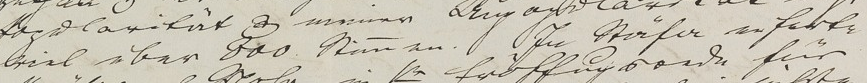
viel über 800 Stimmen. In Stäfa eiferte
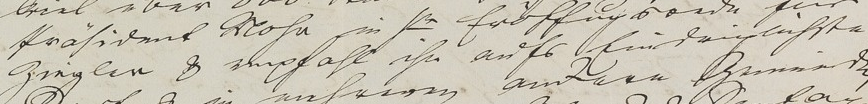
Ziegler & empfahl ihn aufs Eindringlichste.
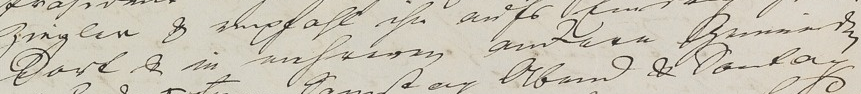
Dort & in mehreren andern Gemeinden
